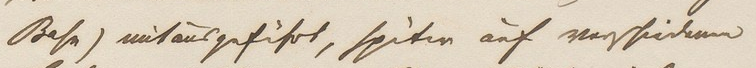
Bahn) mitausgeführt, später auf verschiedenen
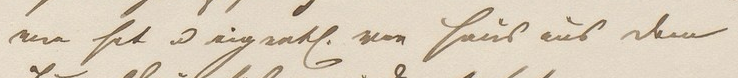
men hat & eigentl. von Haus aus dem
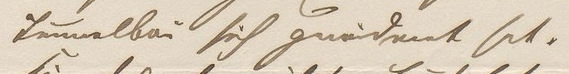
Tunnelbau sich gewidmet hat.
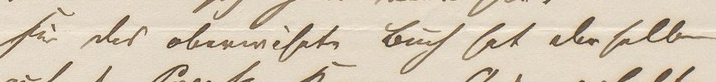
Für das oberwähnte Buch hat derselbe
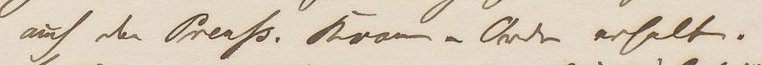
auch den Preuß. Kronen-Orden erhalten.
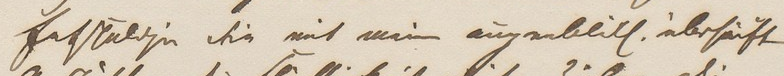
Entschuldigen Sie mit meinen augenblickl. überhäuften
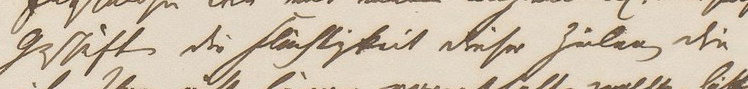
Geschäften die Flüchtigkeit dieser Zeilen, die
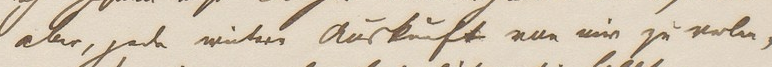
aber, jede weitere Auskunft von mir zu verlan-
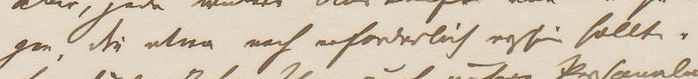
gen,die etwa noch erforderlich erscheinen sollte.
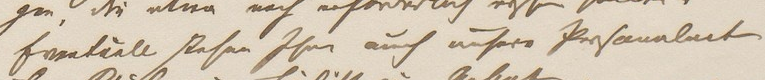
Eventuell stehen Ihnen auch nähere Personalacten
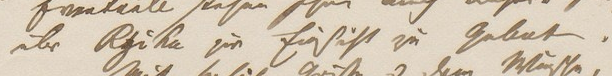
über Rziha zur Einsicht zu Gebot.
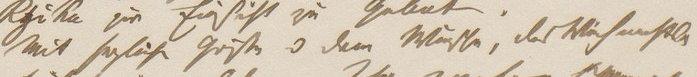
Mit herzlichem Grusse & dem Wunsche, das Weihnachts-
